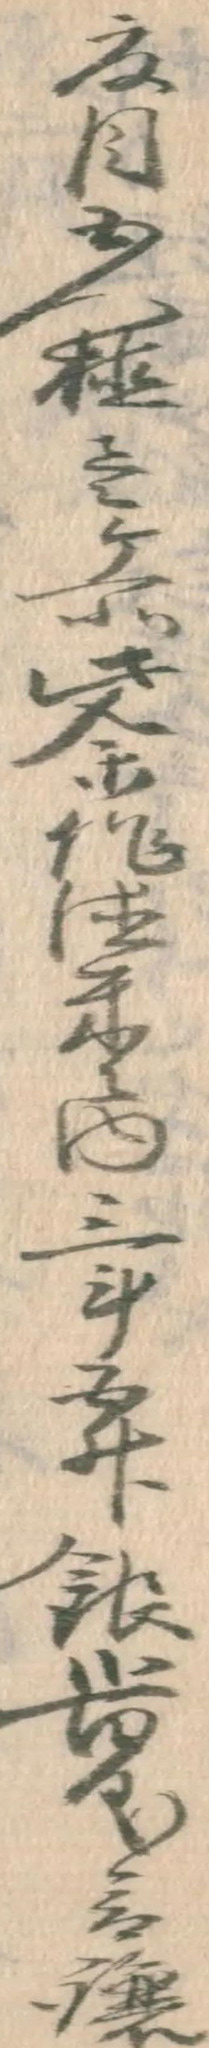夏目五人植壱ヶ所此余作徳米之内三斗五升銀弐百匁ニ而譲
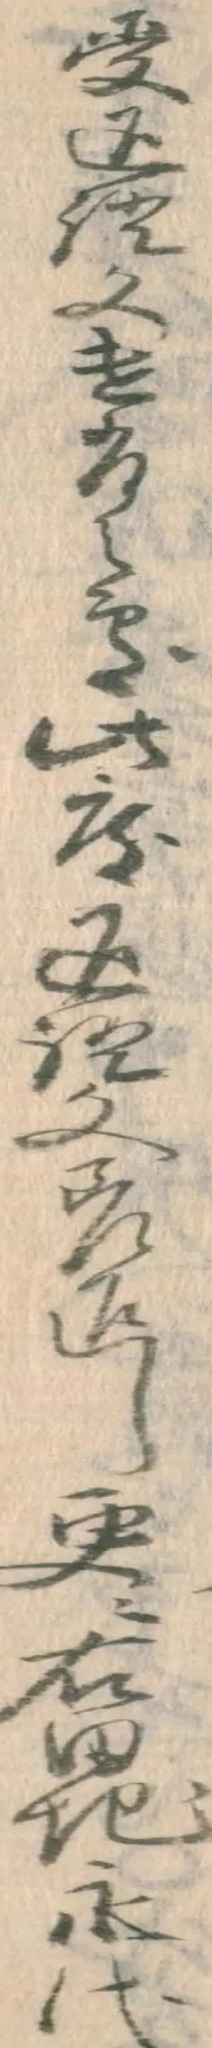受返證文遣有之處此度退證文差返し更ニ右田地永代
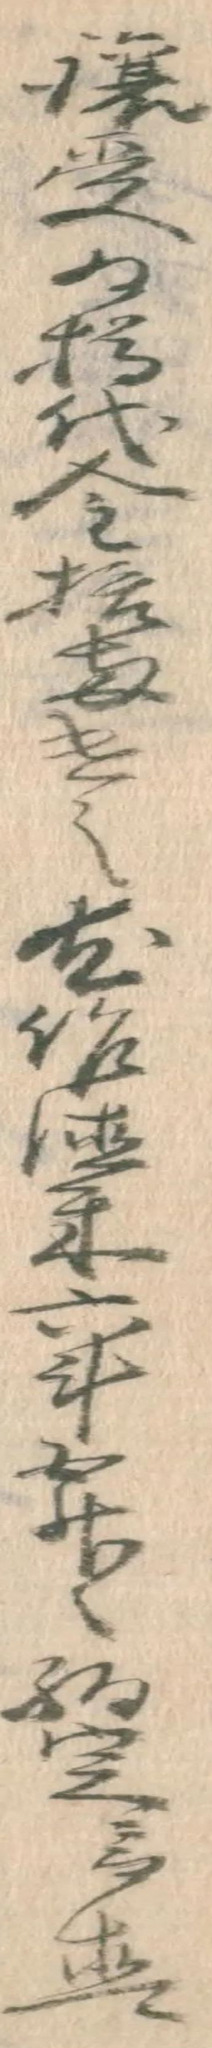譲受為樽代金拾両遣也尤作徳米六斗五升也約定ニ而直ニ
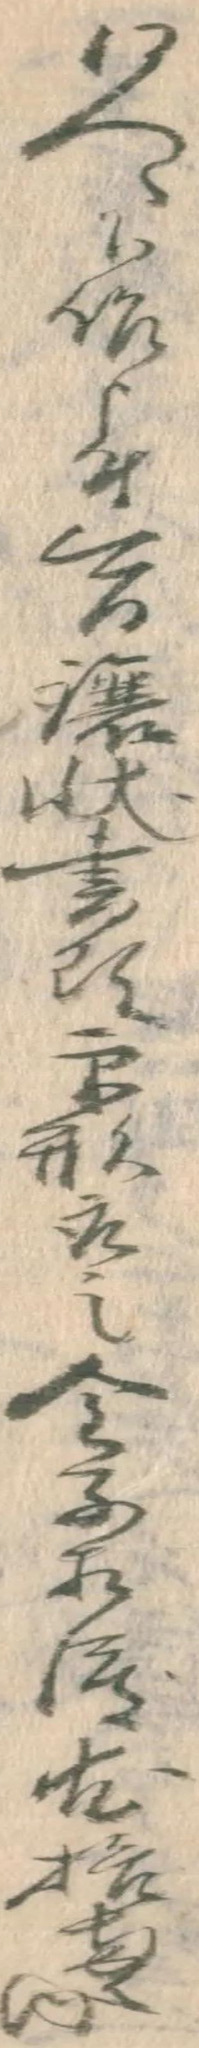同人へ下作申付今日譲状書頭印形取之金子相渡尤拾両弐歩
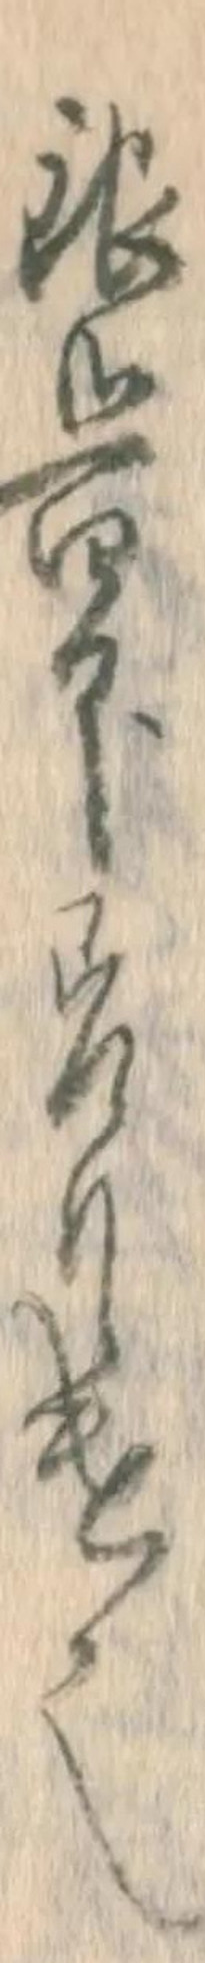銀弐百匁差引遣也
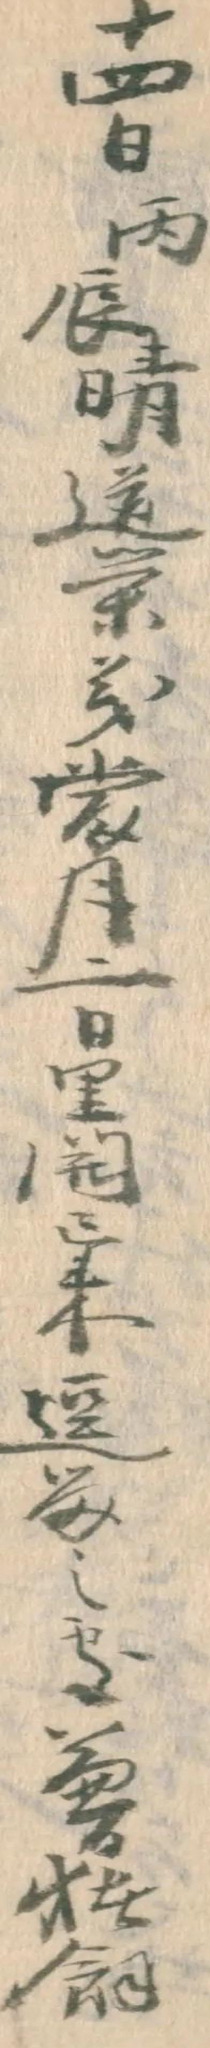十四日丙辰晴道栄義當月二日里開已来逗留之處兼日猪飼
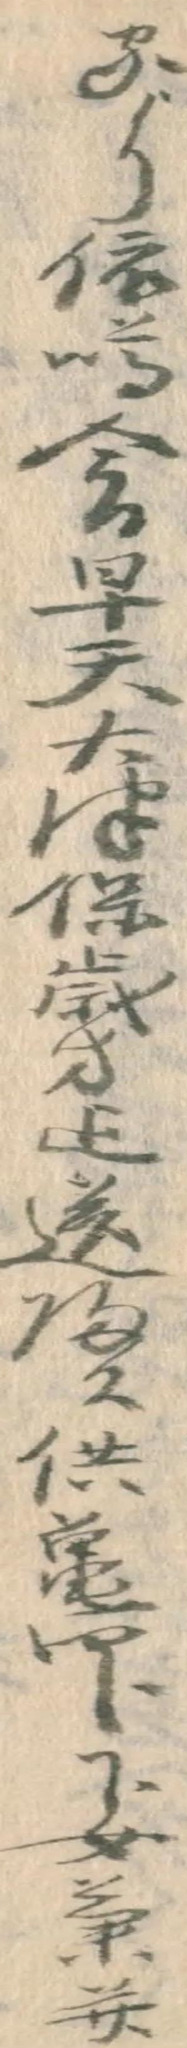家より依噂今日早天大津保歳方迄送帰ス供亀四郎下女兼并
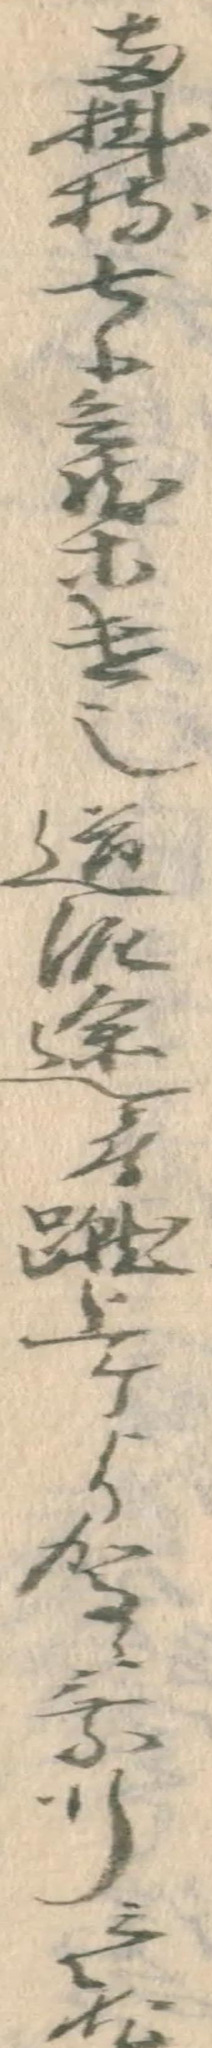両掛持七匁兵共等遣也道泥途ニ付蹴上ケより駕ニ乗行云々尤
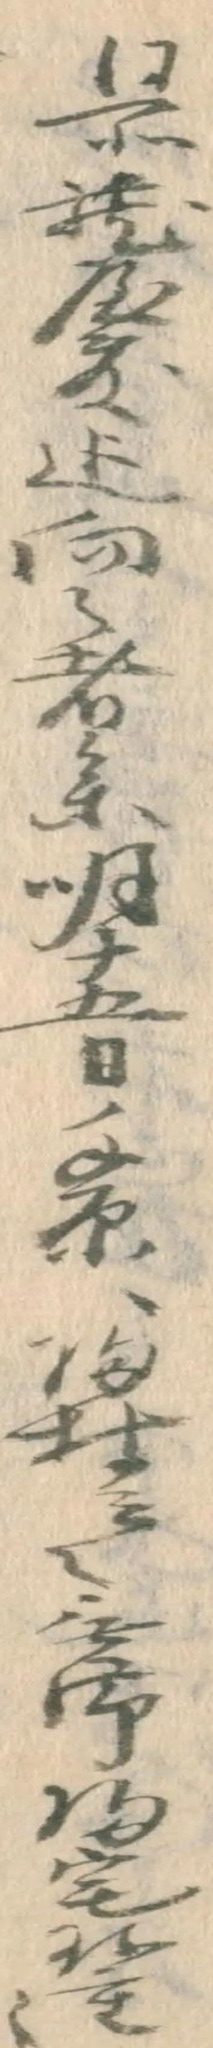同所蔵屋敷へ迄向之者参明十五日手原へ帰村云々無滞帰宅致重々
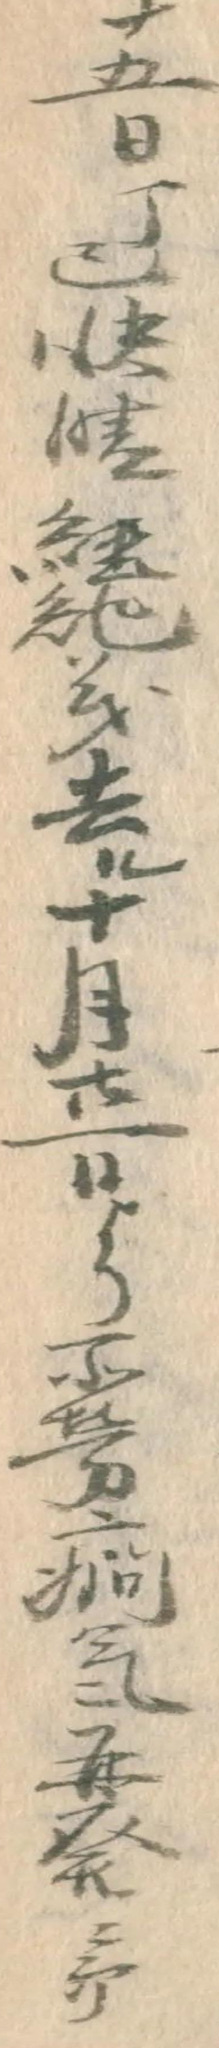十五日丁巳快晴経紀義去ル十月廿一日より所勢釈病気再発ニ而

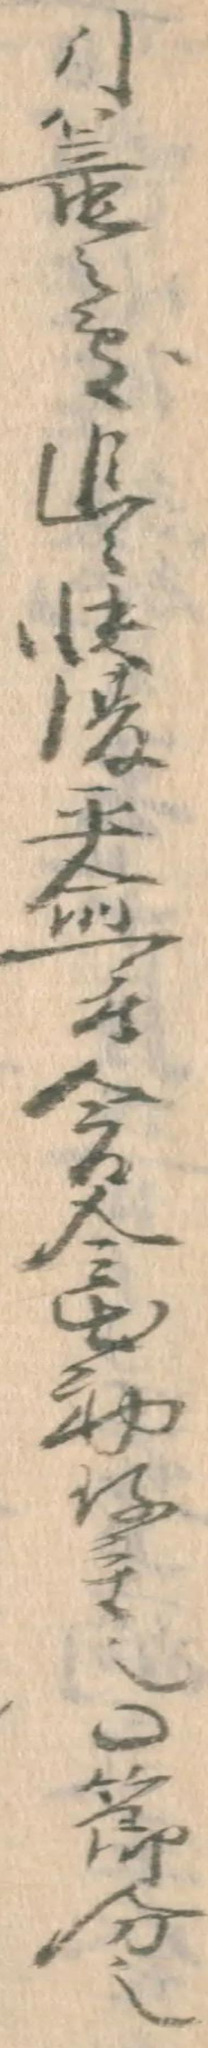引篭之處追々快復平愈ニ付今日令出勤致珍重也○節分也
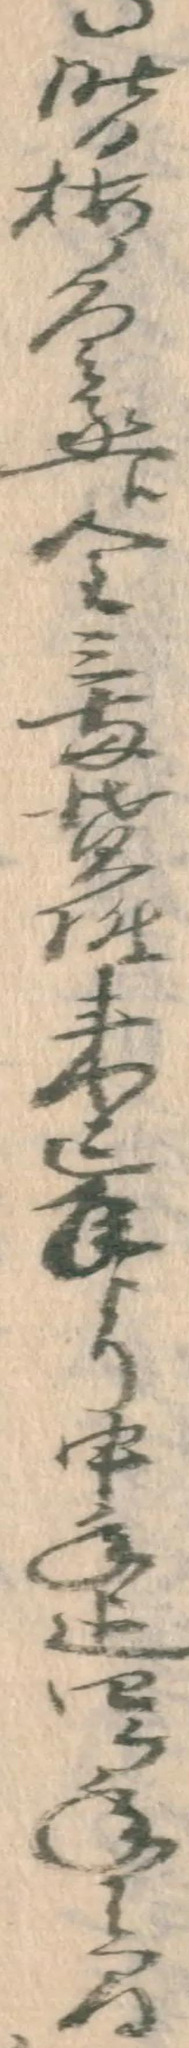○昨日梅之之丞え金三両貸附来巳年度より申年迄四ケ年之間
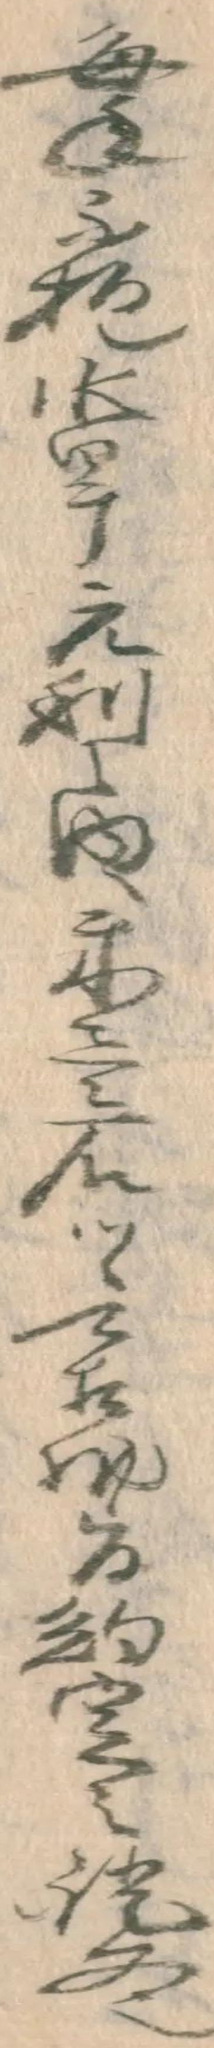毎年不抱水旱元利之内へ米壱石ツヽ可相納旨約定之證文也
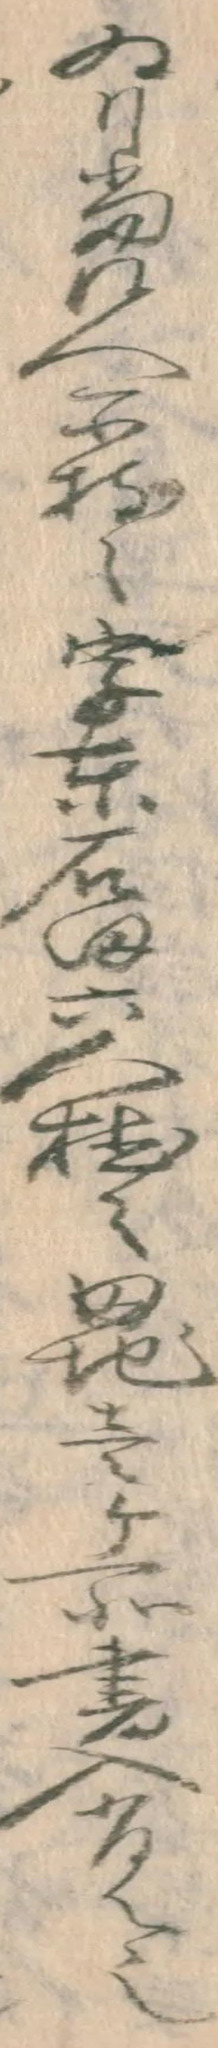為引當同人所持之字東石田六人植之田地壱ヶ所書入有之也
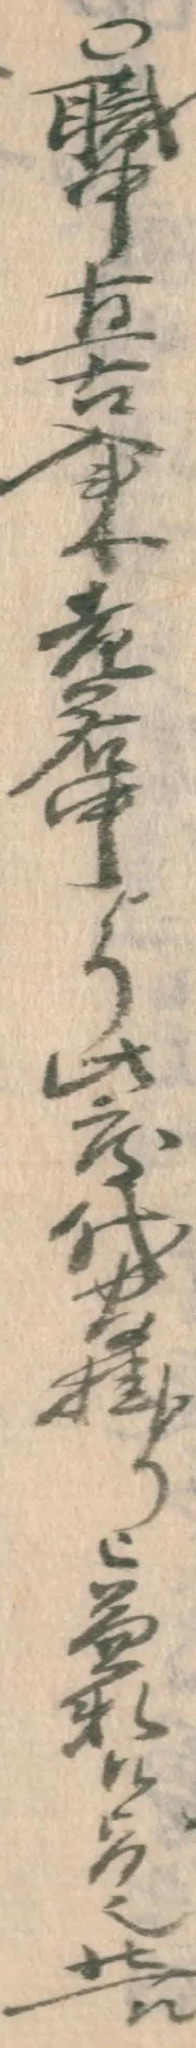○職中直古入来老若中より此度代官掛り被兼頼候旨也然ル
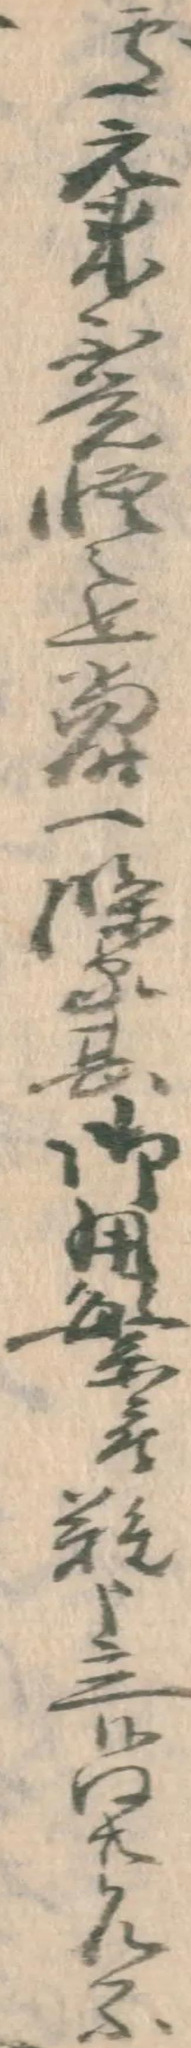處元来不覚悟之上當時一條家甚御用繁ニ付難申立候得共乍不
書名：賀茂社記録. 第66冊
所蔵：国立国会図書館 National Diet Library, JAPAN
